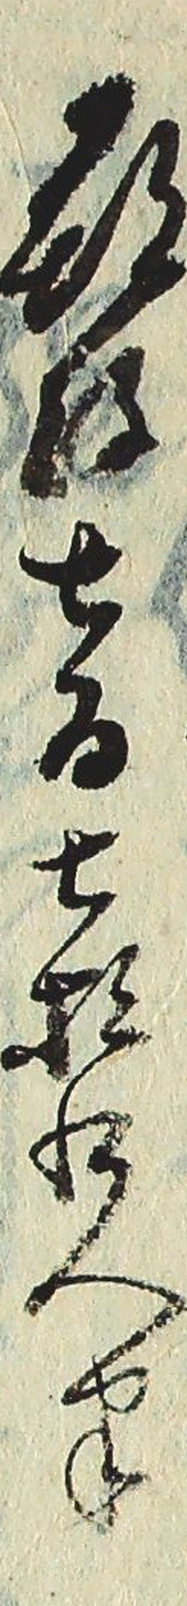郡役七百七拾九人半
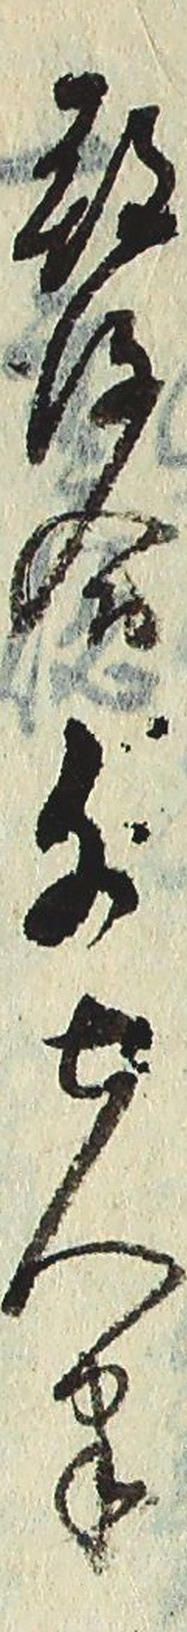郡役合千七人半
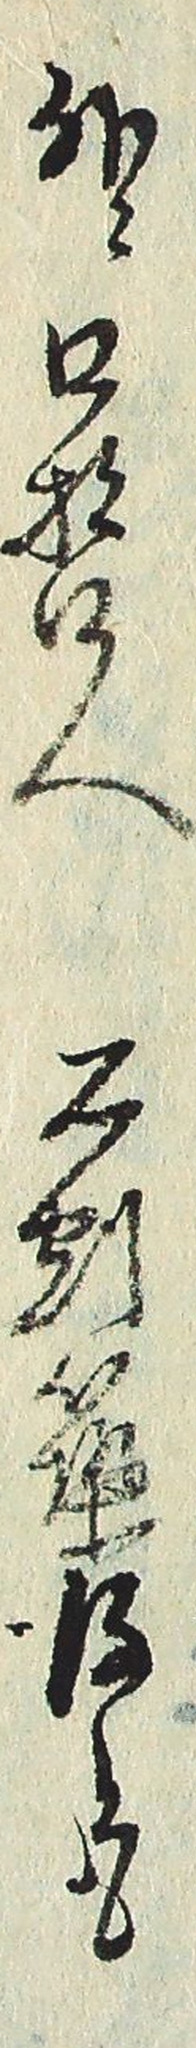外に四拾四人石割築役とも

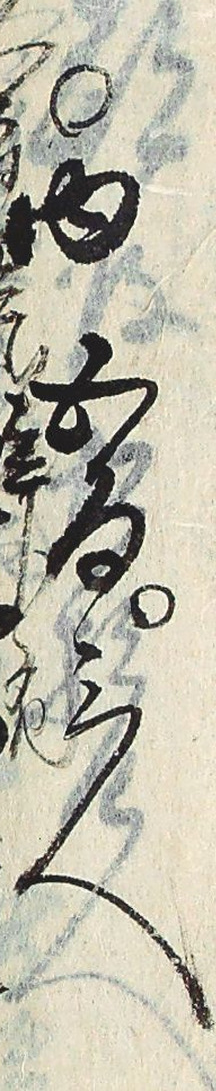内五百〇三人
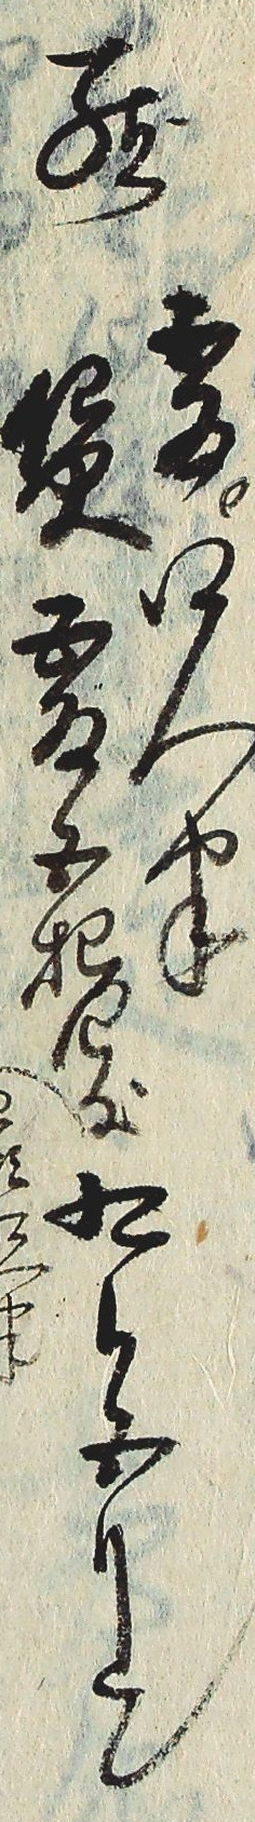賃五百五拾四匁九分五厘也
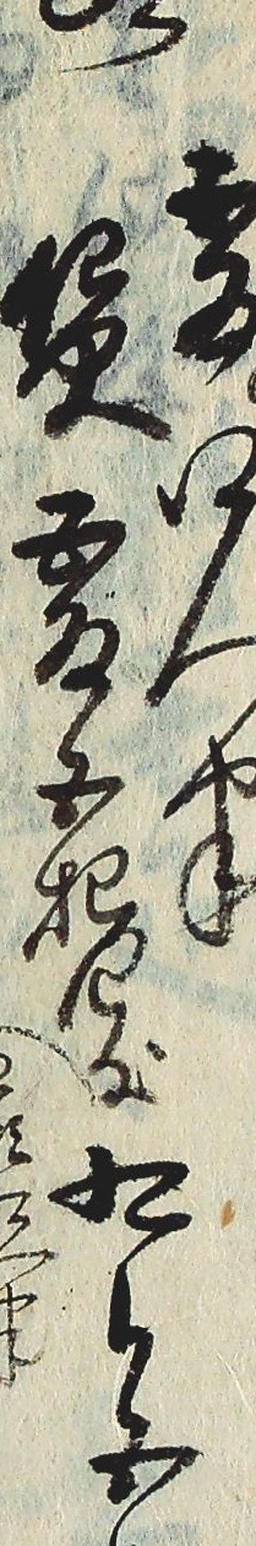賃五百五拾四匁九分五厘也
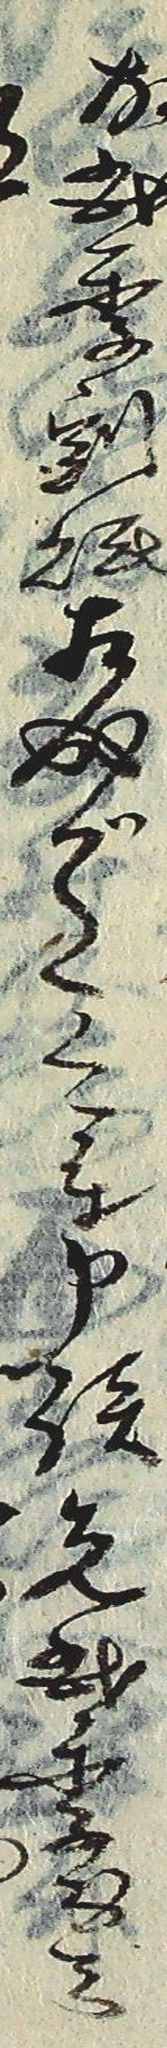故当季割賦相成がたく候に付申談先当季分は
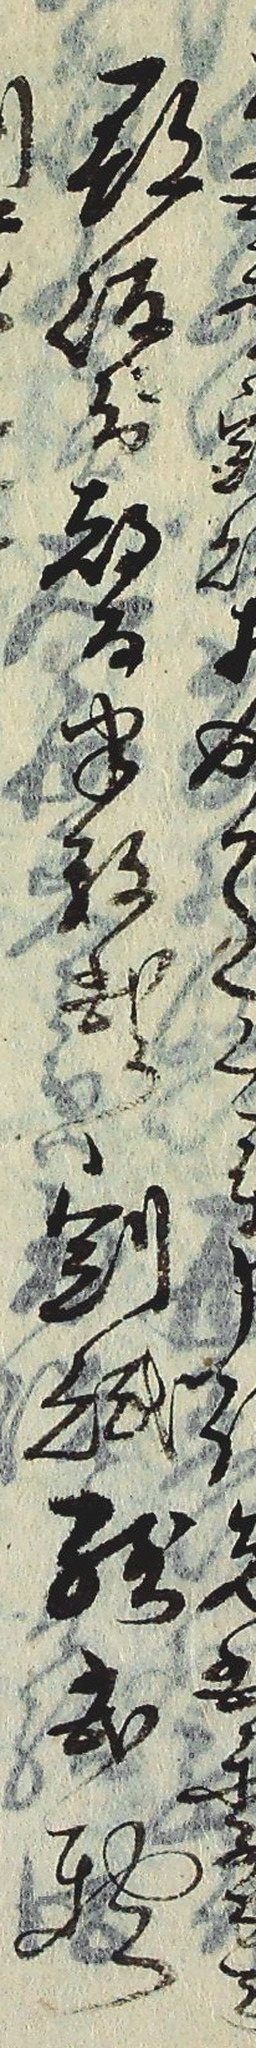郡役分都て半数当に割賦残当秋
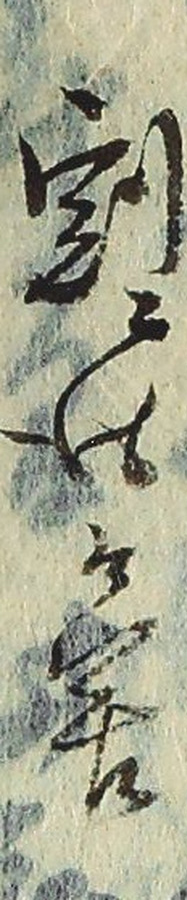割に仕候筈
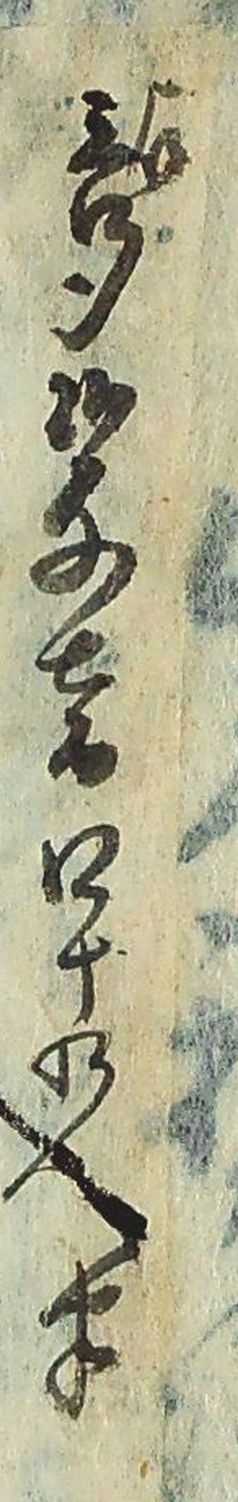三口〆弐千七百四十九人半
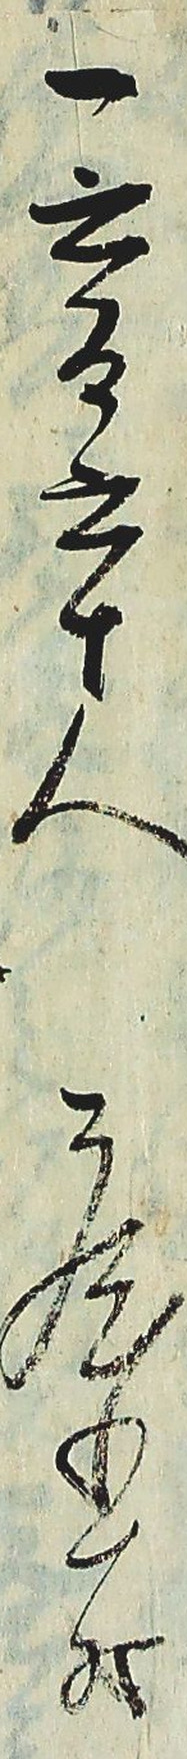一六百六十人蔵本村
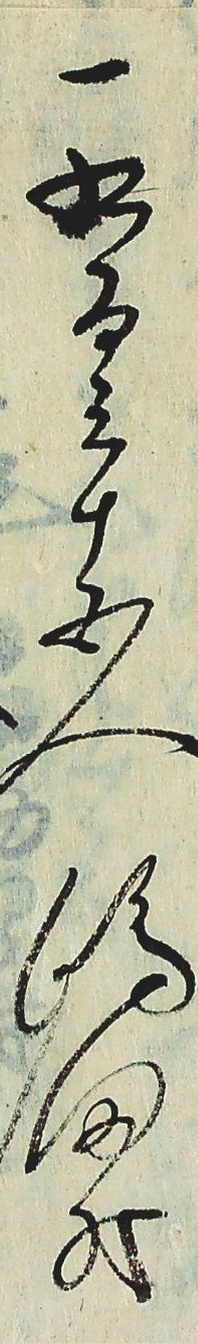一九百三十五人島田村
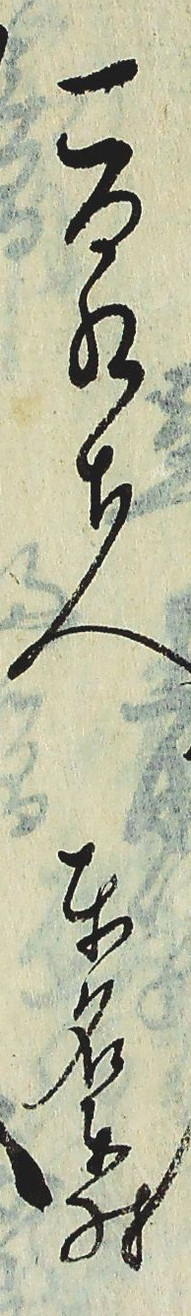一百九十人東名東村
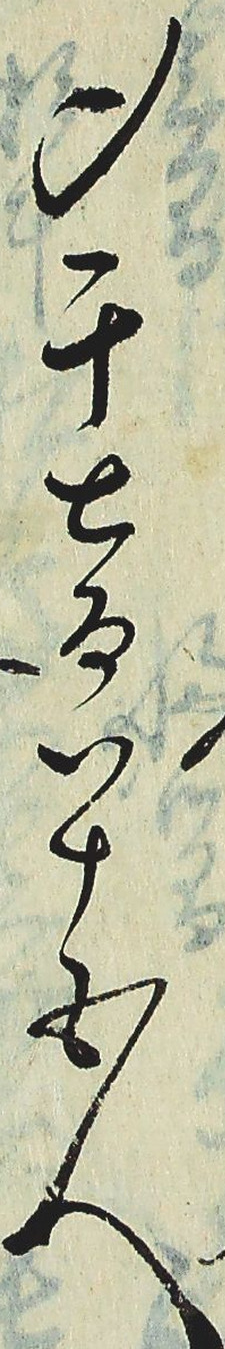〆千七百八十五人
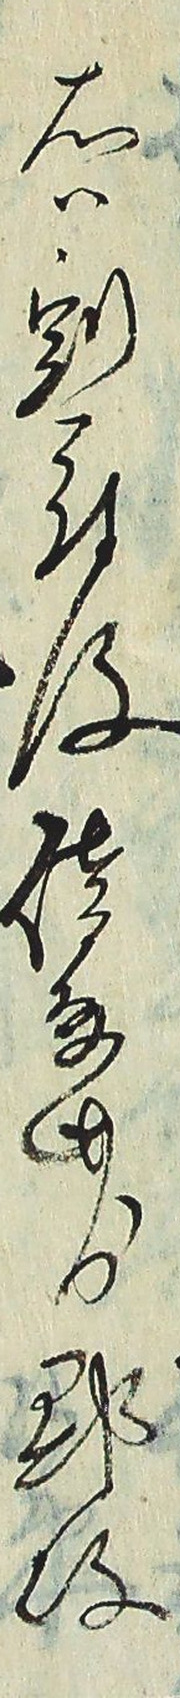右は割苻後佐藤氏ゟ郡役
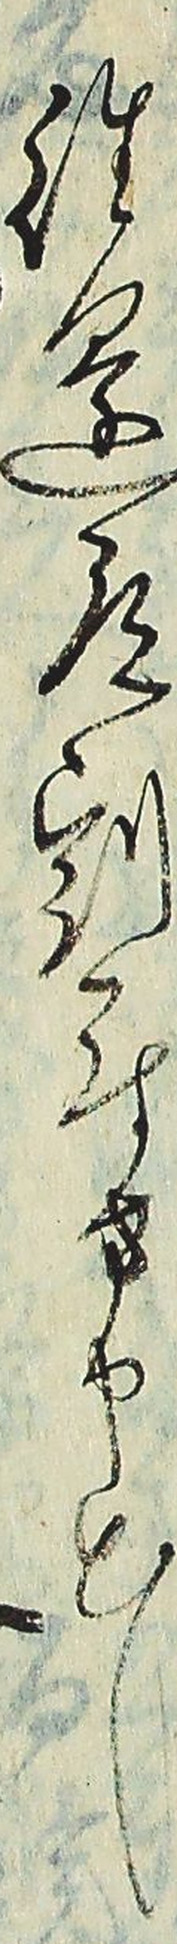往還道割付方申出候
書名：名東郡中諸割賦元帳
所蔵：鳴門教育大学 Naruto University of Education
